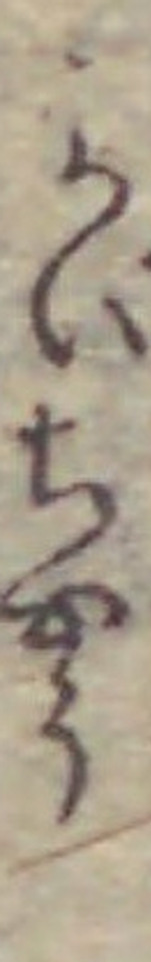かいちやう
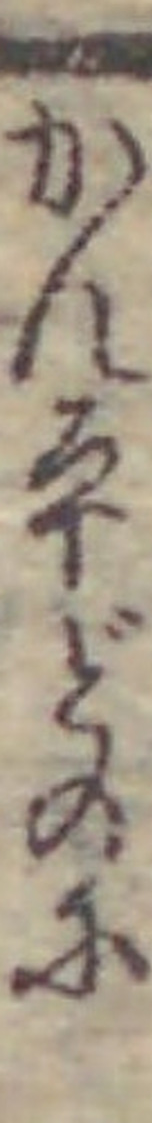かん平どのに
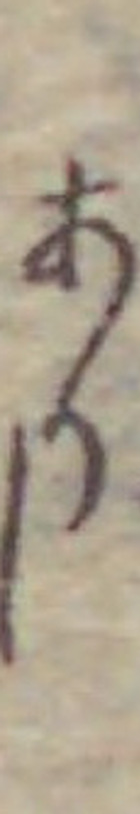ありし
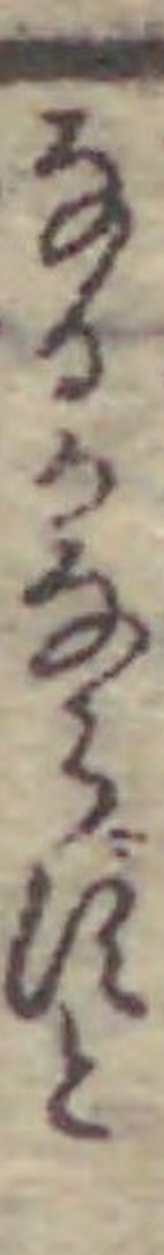なるかならずと
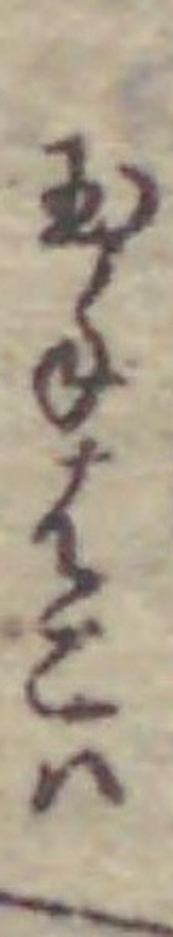玉手はこは
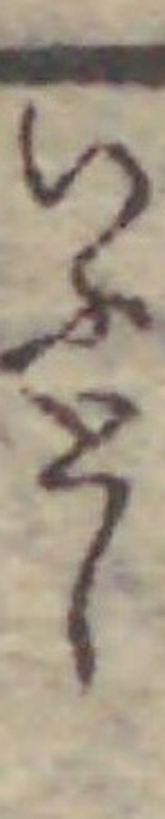いふとし
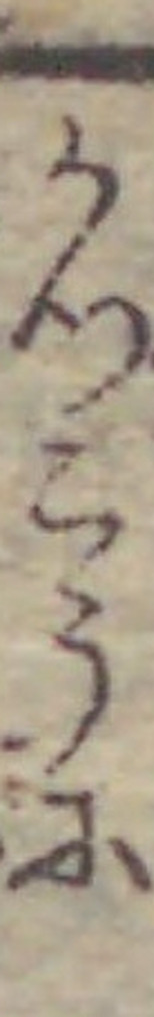かつこうに
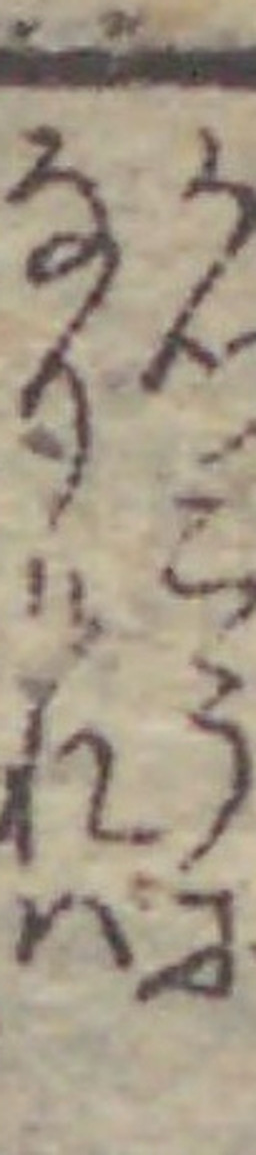なりければ
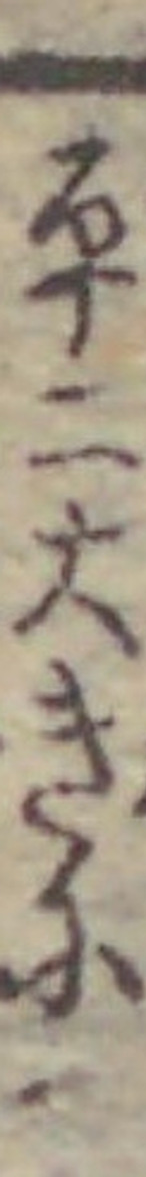平二大きに
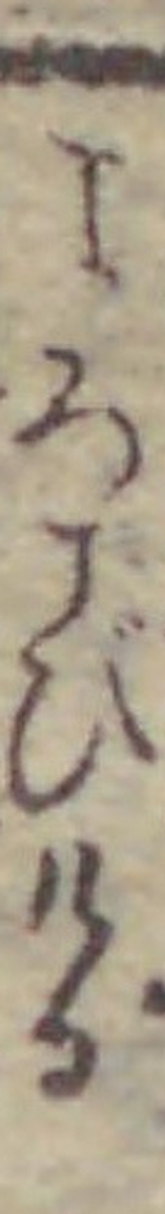よろこびける
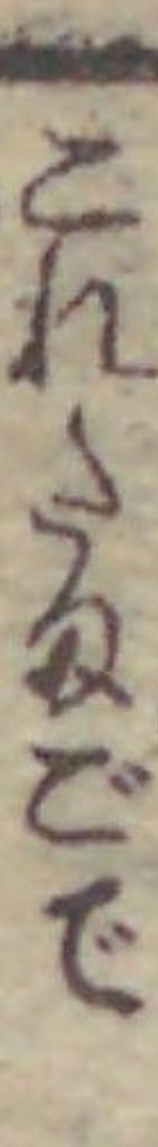これたまごで
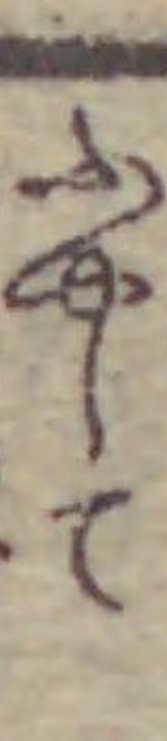ふやして
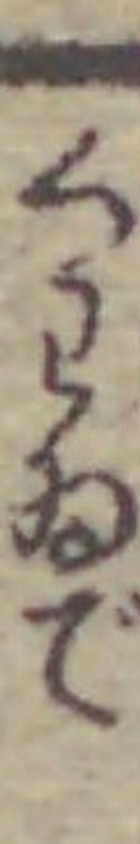くわゐで
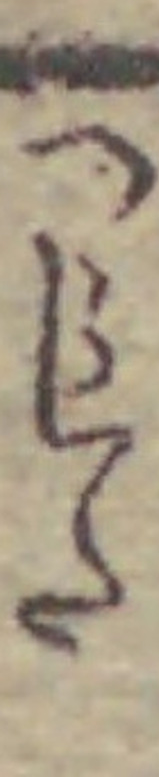へらした
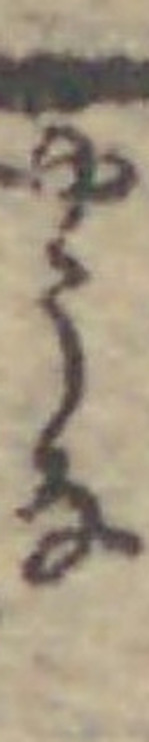やうな
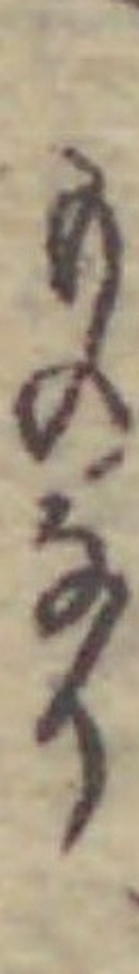ものなり
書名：箱入娘面屋人魚 3巻
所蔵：国立国会図書館 National Diet Library, JAPAN
